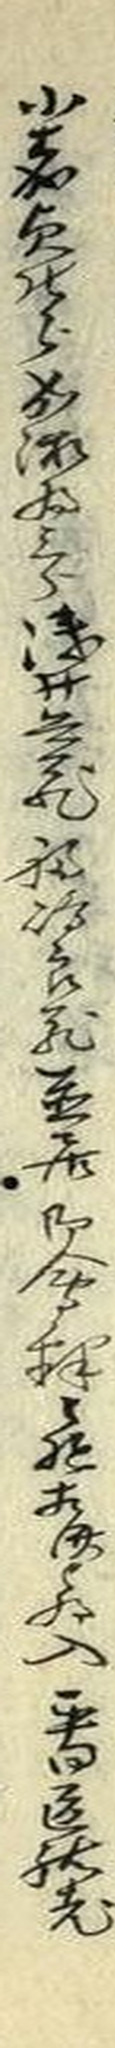小森貞次郎成瀬為三郎浅井兵蔵福嶋良蔵並居御会釈被遊相済被為入平田道祐老
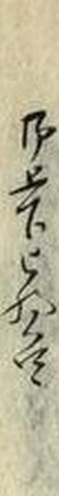御上下被為召候
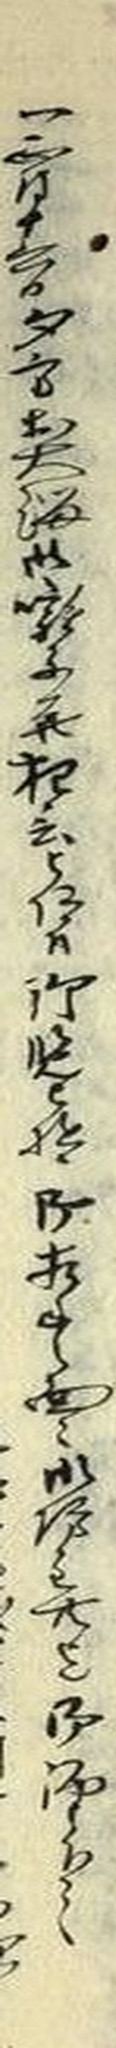一正月十六日夕方於大溜御囃子幷狂言被仰付御覧被遊候御相手之面々御坊主共迄御酒被下之
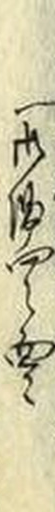御側向之面々
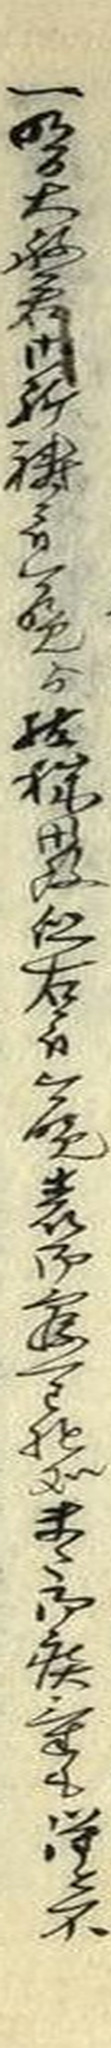一明日大般若御祈祷ニ付今晩ゟ服穢御役但右ニ付今晩表御寝可被遊処未た御疾気もと不
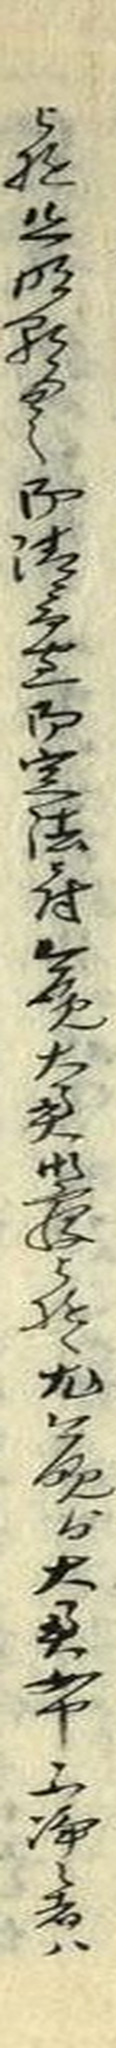被遊且明朝ゟ之御清ニ而宜御定法ニ付今晩大奥御寝被遊候尤今晩ゟ大奥女中不浄之者ハ
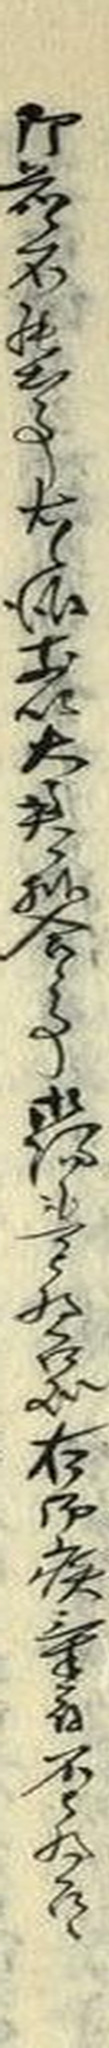御前へ不罷出事右之趣前以大奥へ掛合候事御湯も可被為召処右御疾気ニ付不被為召候
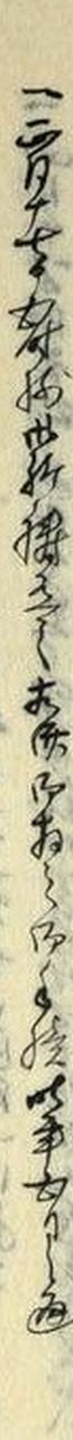一正月十七日五時揃御祈祷有之相済御拝之御手続昨年五月之通
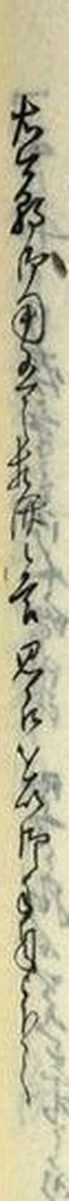右今朝御用有之相済候節思召を以御手自被下之
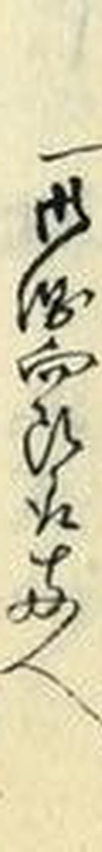御側向頭取両人
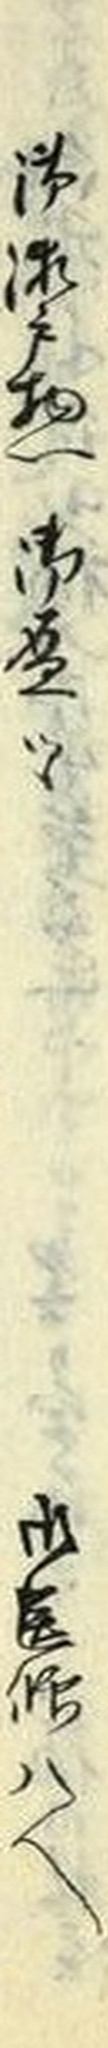御瀬戸物一御盃一ツヽ御医師八人
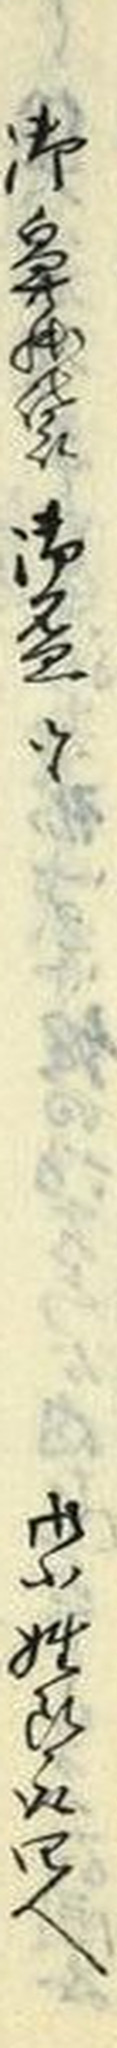御鼻紙袋御盃一ツヽ御小姓頭取四人
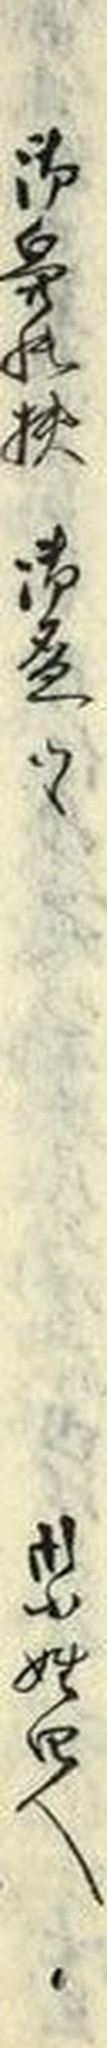御鼻紙挟御盃一ツヽ御小姓四人
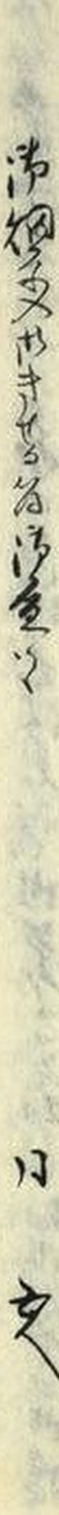御煙草入御きせる筒御盃一ツヽ同五人
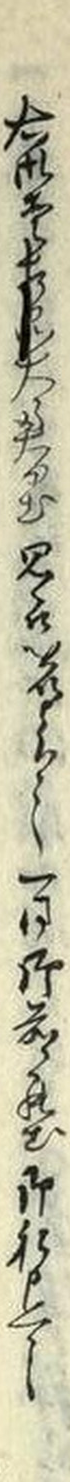右御愛相品大奥ゟ出思召を以被下之一同御前へ罷出御礼申上之
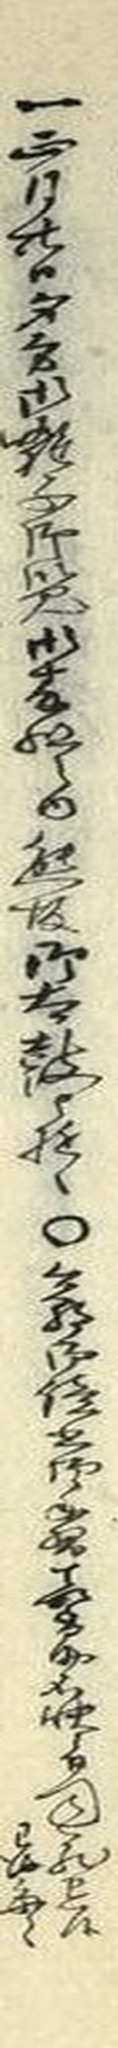一正月廿日夕方御囃子御覧御番組之内熊坂御太鼓被遊候〇今朝御読書御手習者馨助不快ニ付周蔵申上候已後毎々
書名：少傅日録抄（斉善付側向頭取日記、在府）
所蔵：福井県文書館 Fukui Prefectural Archives
